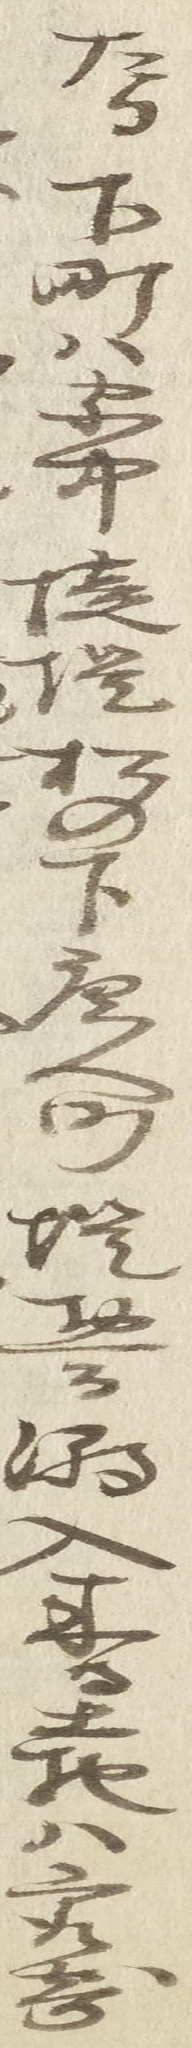たる下町は家中境堤松の下唐人町堤惣て潮入来る土地は最寄
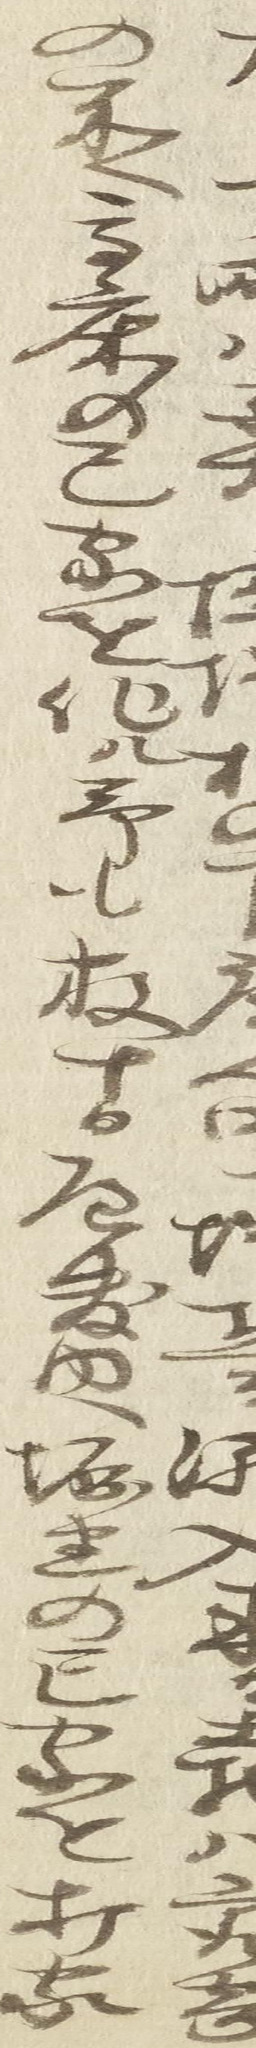の所へ高床の己家を作る予も数十日屋敷内へ堀建の己家を打家
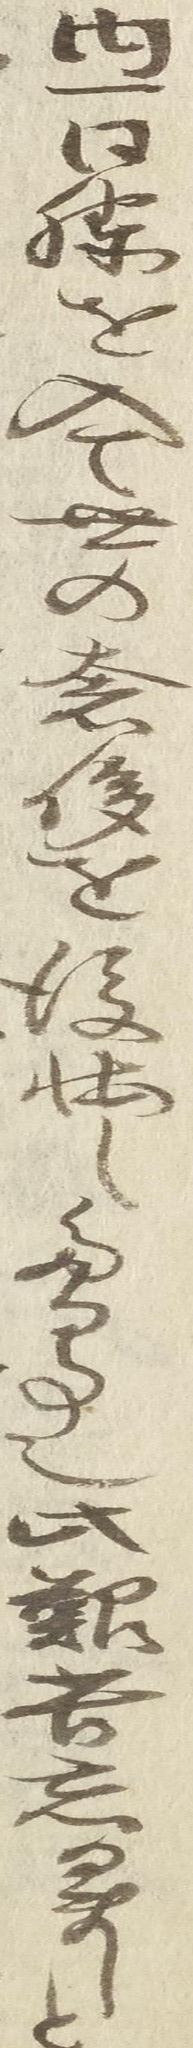内一同孫を入て世の奢侈を後悔したる事也此艱苦忘るましと
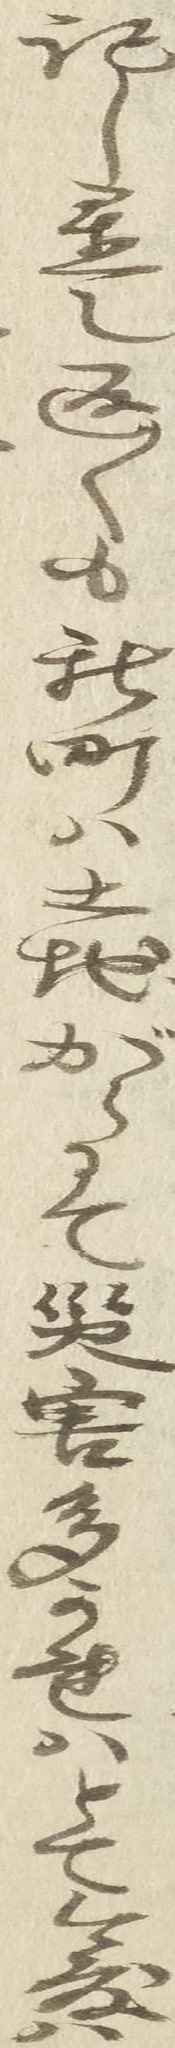記し置し返ゝも新町は土地がらにて災害多かれはとて今度は
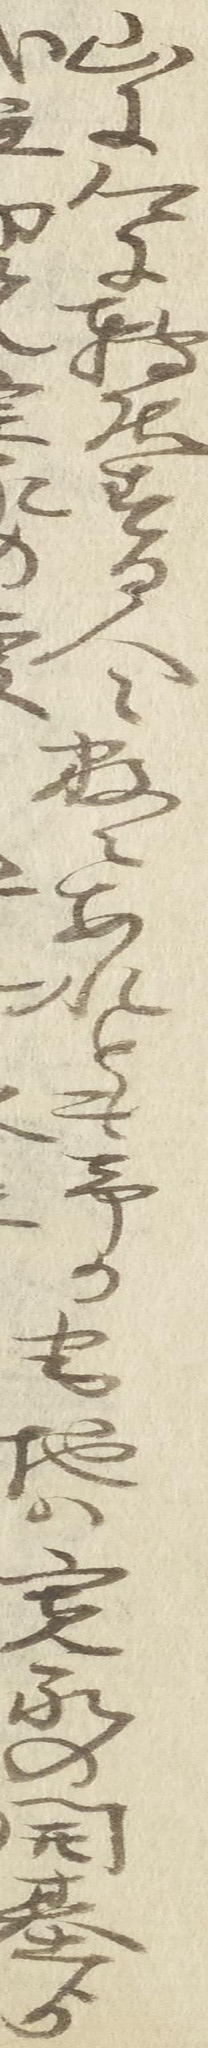山に郷に転居する人々数々あれとも予の宅地は寛永の開基より
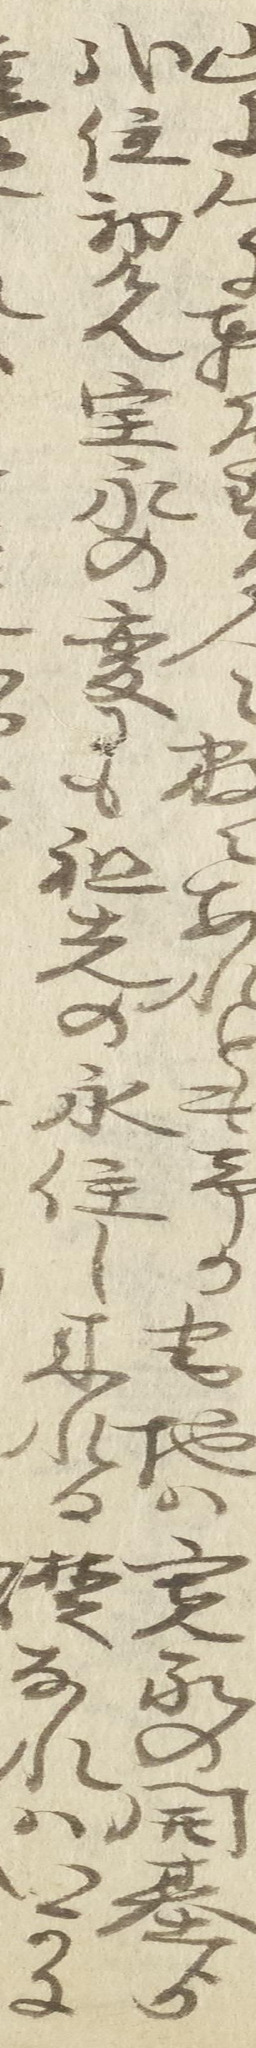哉住初けん宝永の変にも祖先の永住し来れる礎なれはいかに
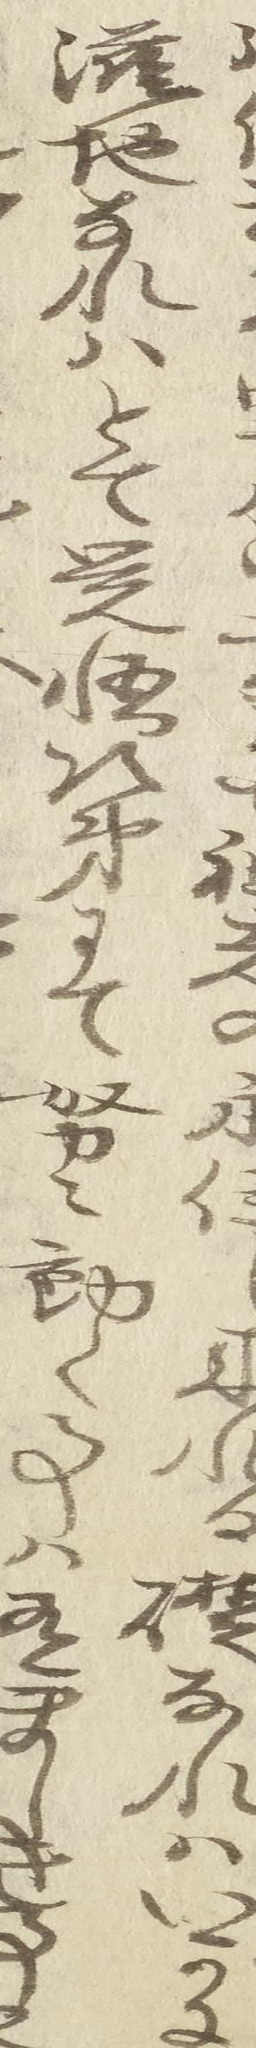滋地なれはとて覚悟次第にて努々動く事は有ましき事也
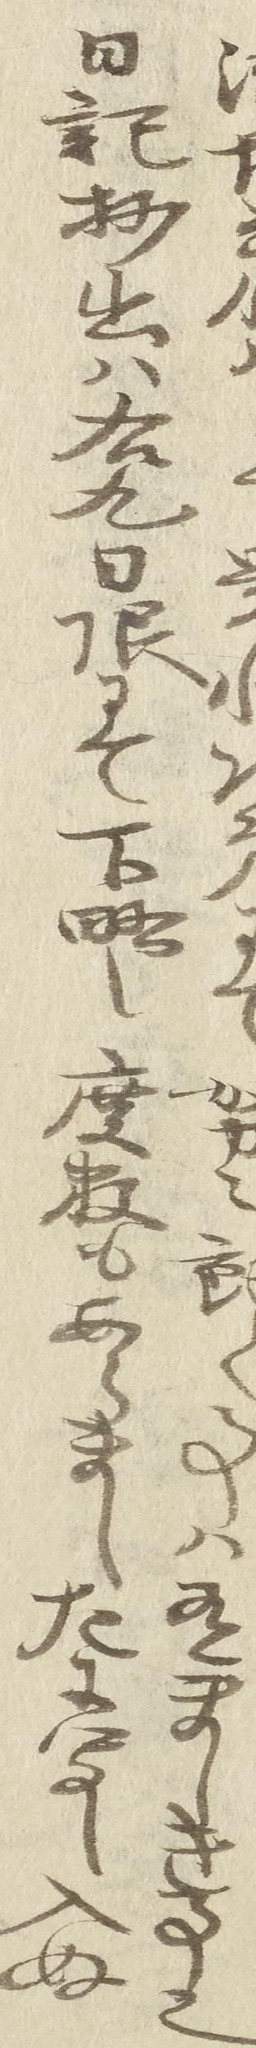日記抄出は右九日限にて下略し度数もあらまし左に写し入ぬ

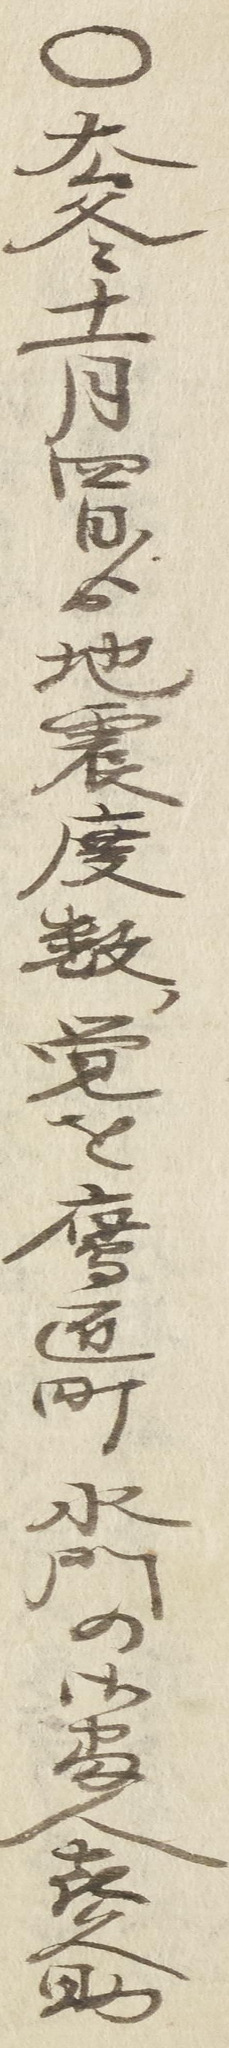〇去冬十一月四日より地震度数の覚を鷹匠町水門の御番人喜久助
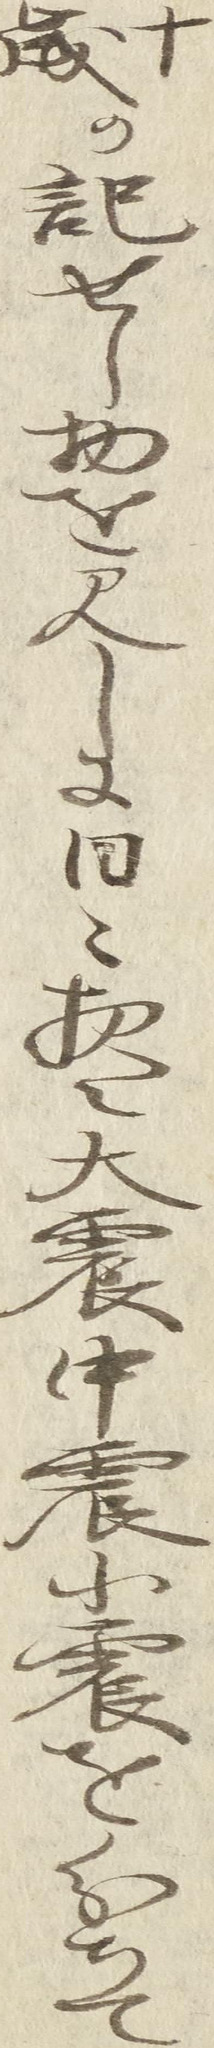七十五歳の記せし物を見しに日々夜々大震中震小震を分ちて
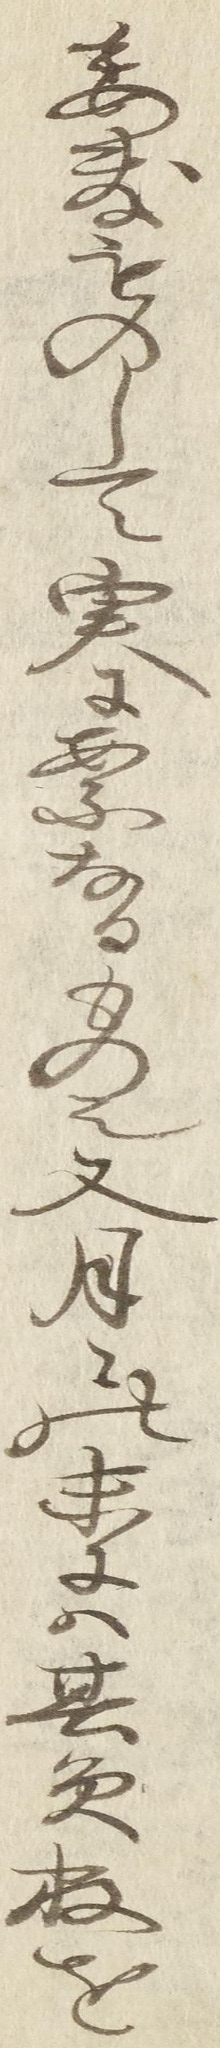委敷ものして実に要なるもの也又月々の末には其員数を
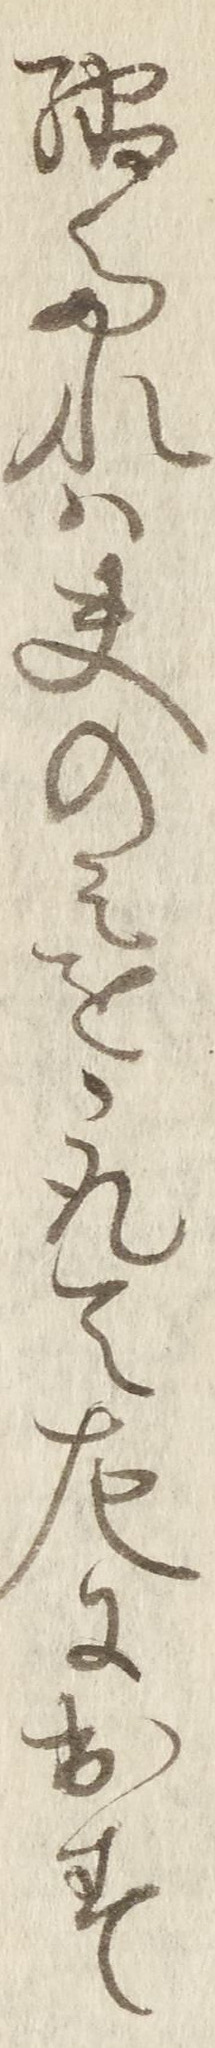縮たれは夫のみを取て左に出す
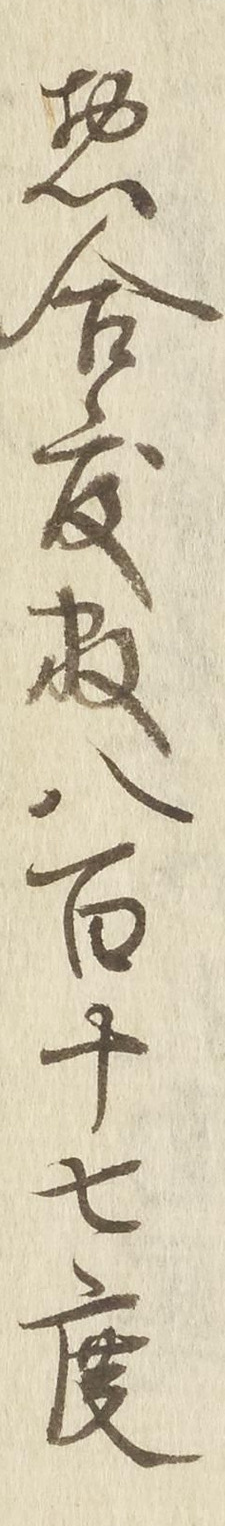惣合度数八百十七度

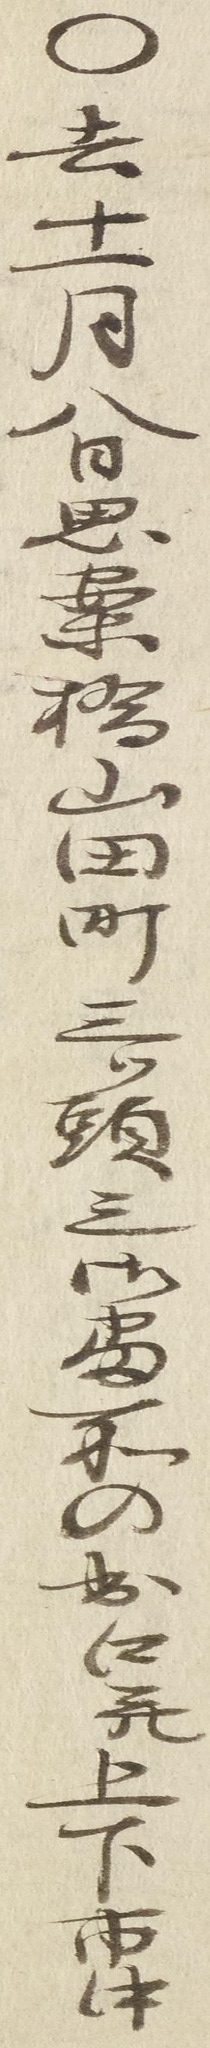〇去十一月八日思案橋山田町三ッ頭三御番所の出口幷上下市中
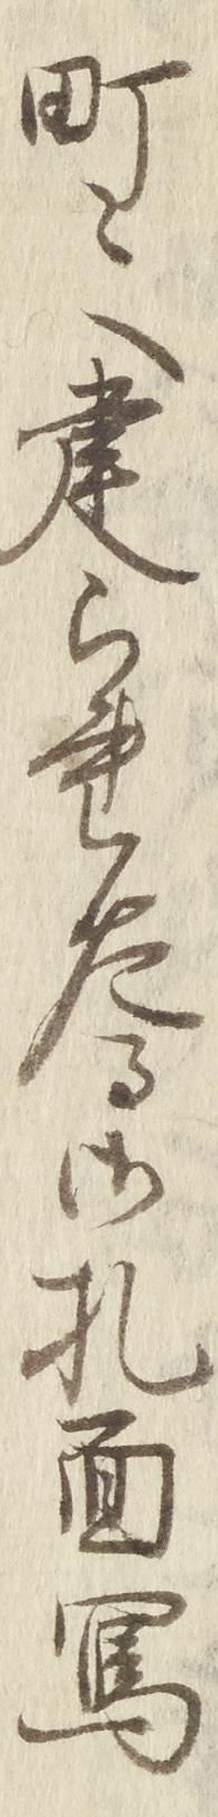町々へ建られたる御札面写
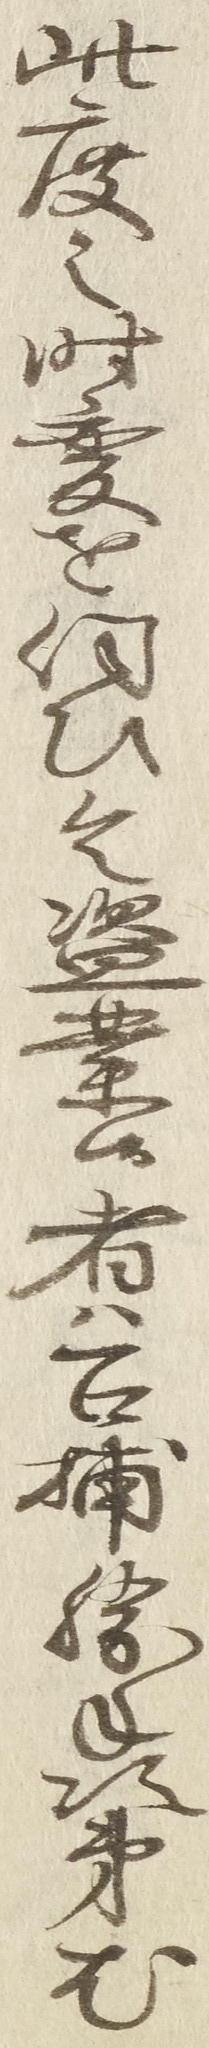此度之時変を伺ひ令盗業候者は召捕勝手次第尤
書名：地震記　上
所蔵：東京大学地震研究所図書室 Earthquake Research Institute Library, The University of Tokyo, JAPAN
